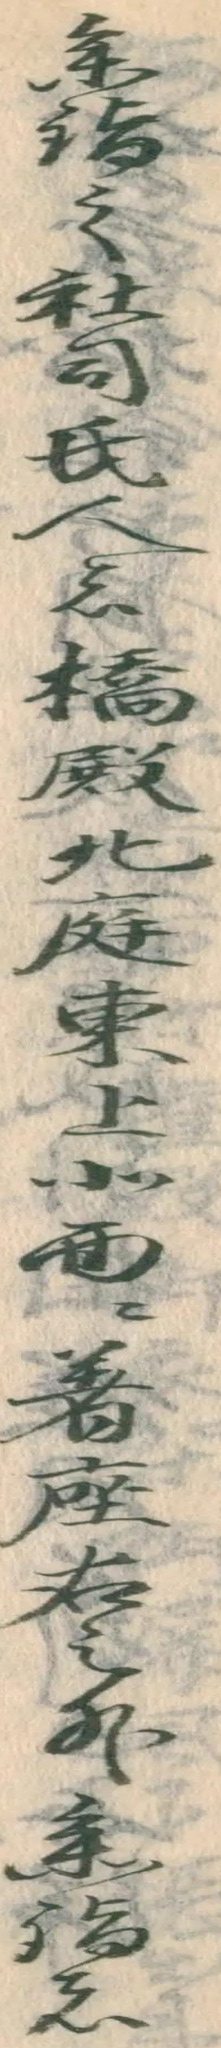参詣之社司氏人は橋殿北庭東上北面ニ着座右之外参詣は
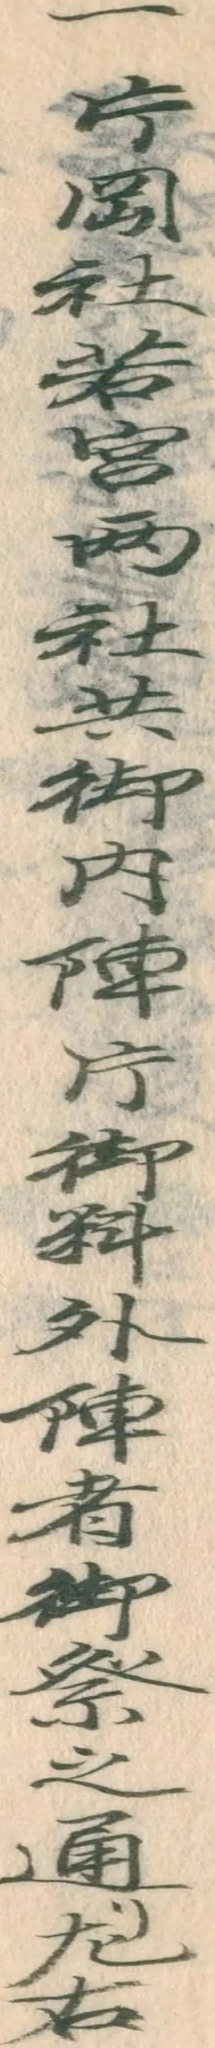一片岡社若宮両社共御内陣片御料外陣は御祭之通左右
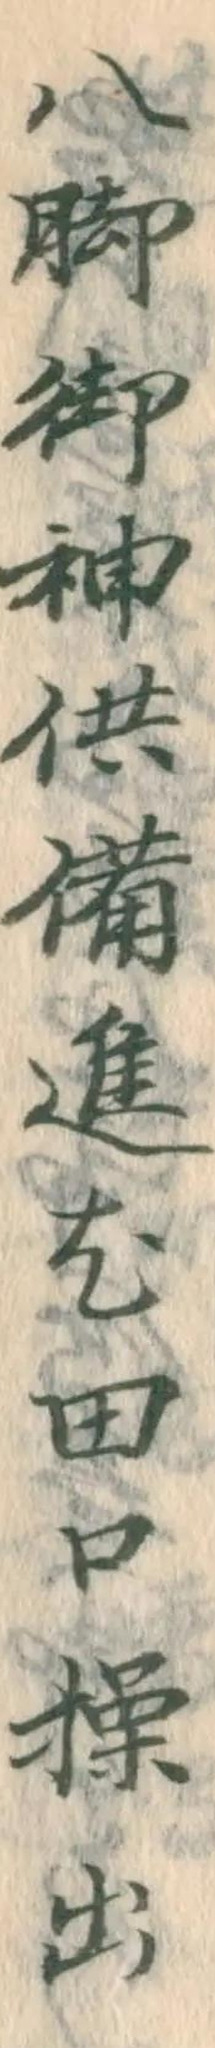八脚御神供備進尤田口操出
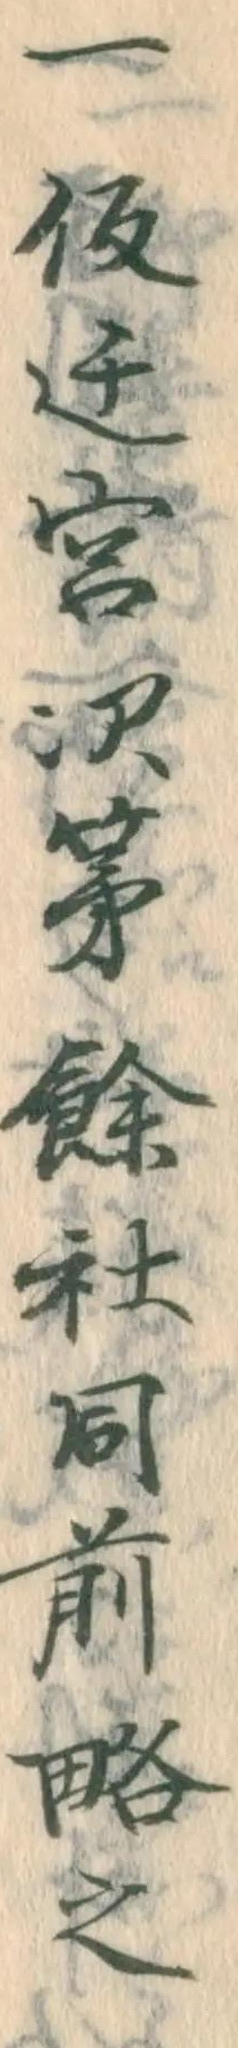一仮迁宮次第余社同前略之
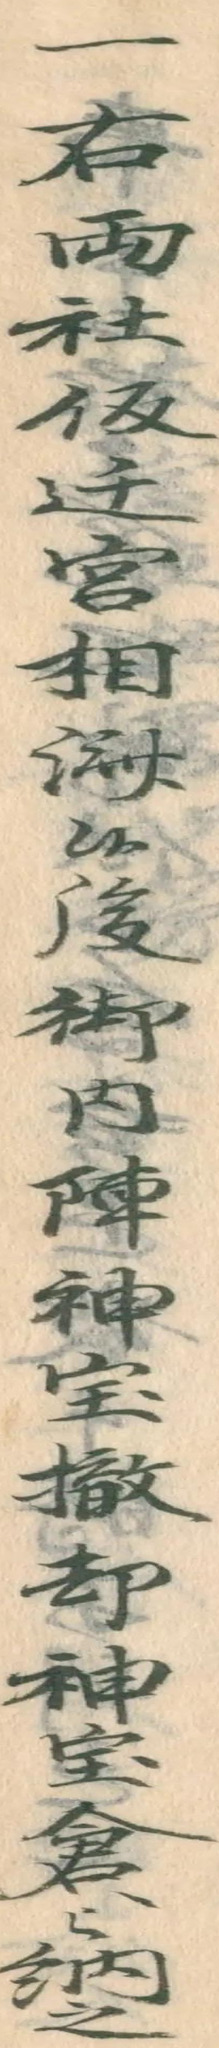一右両社仮迁宮相済候後御内陣神宝撤却御神宝倉へ被納之

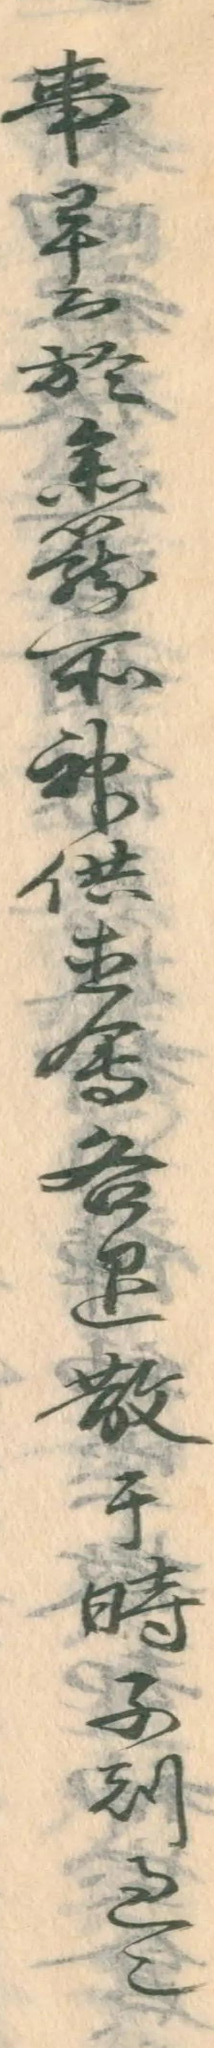事畢而於参籠所神供直会各退散于時子刻過也
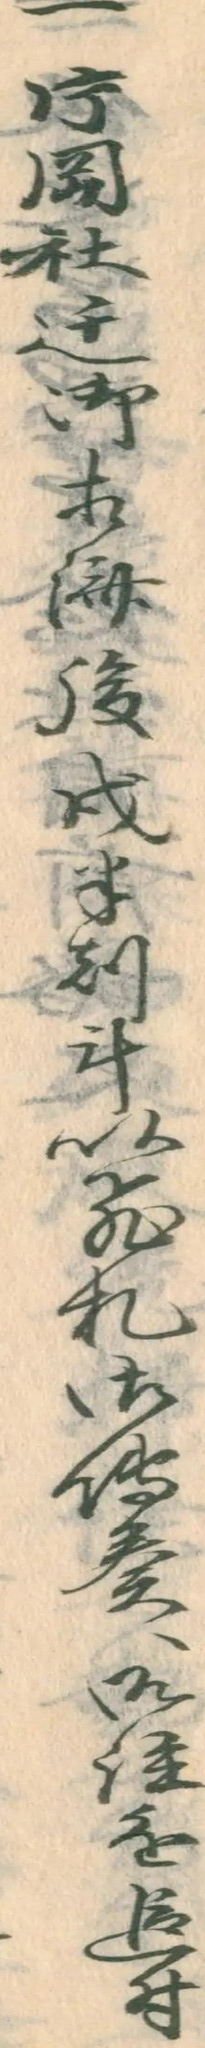一片岡社迁御相済後戌半刻計以飛札御伝奏へ御注進追付
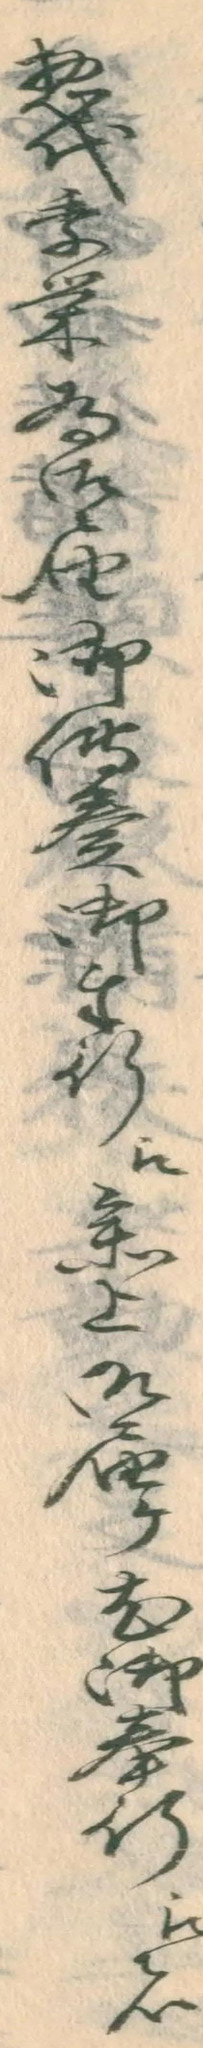惣代季栄為御届御伝奏御奉行江参上御届ケ尤御奉行江は
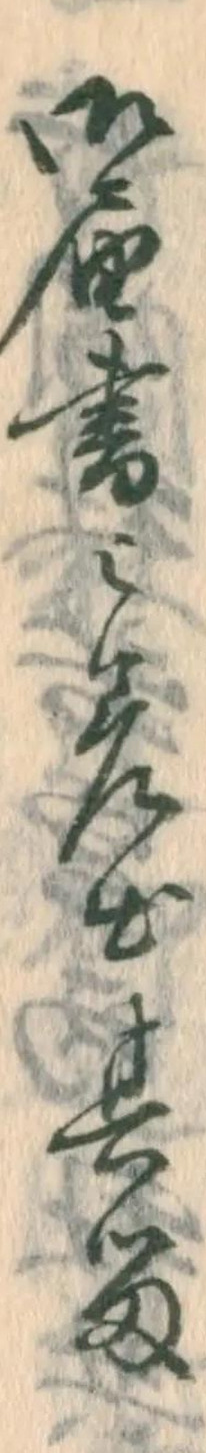御届書被差出其留
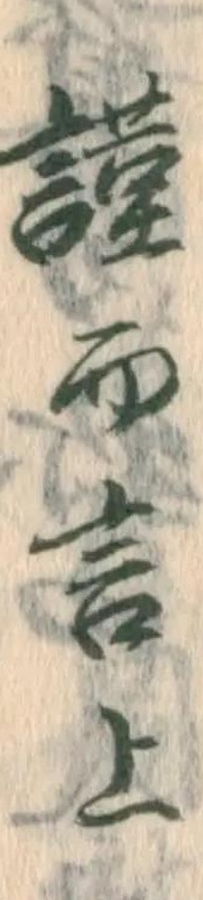謹而言上
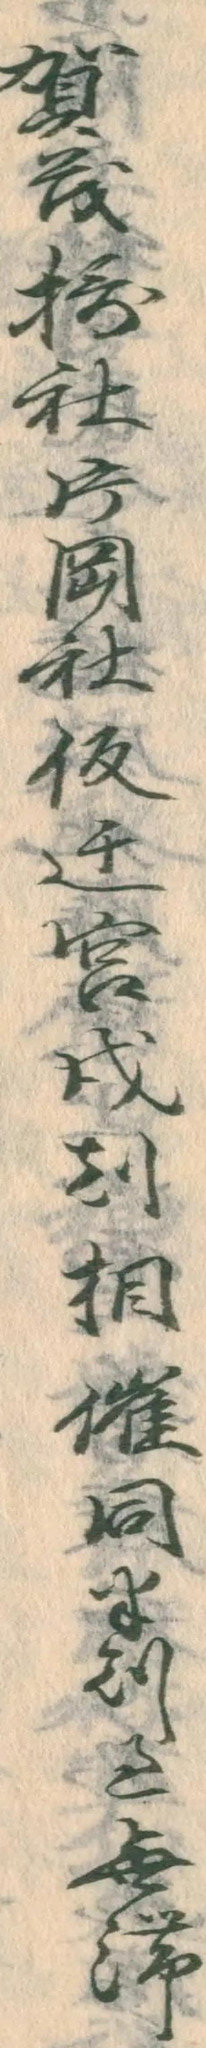賀茂摂社片岡社仮迁宮戌刻相催同半刻過無滞
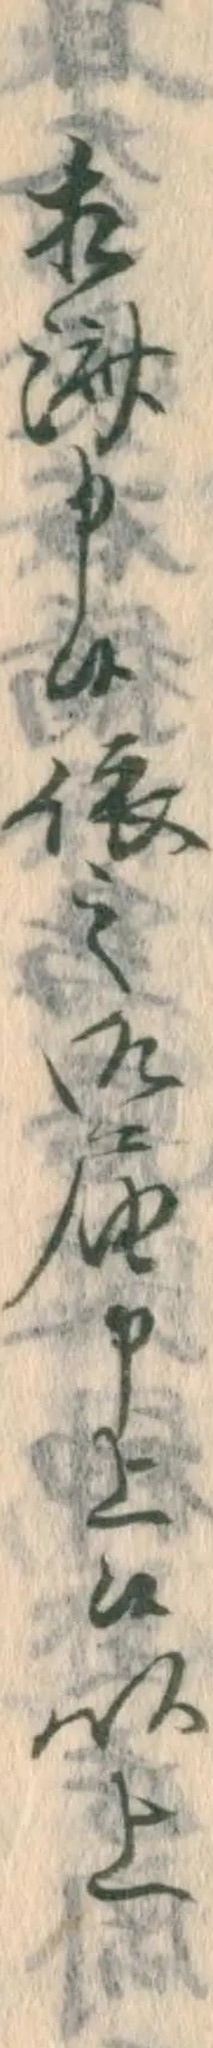相済申候依之御届申上候以上
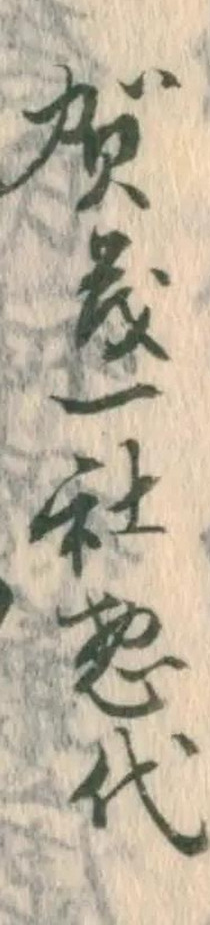賀茂一社惣代
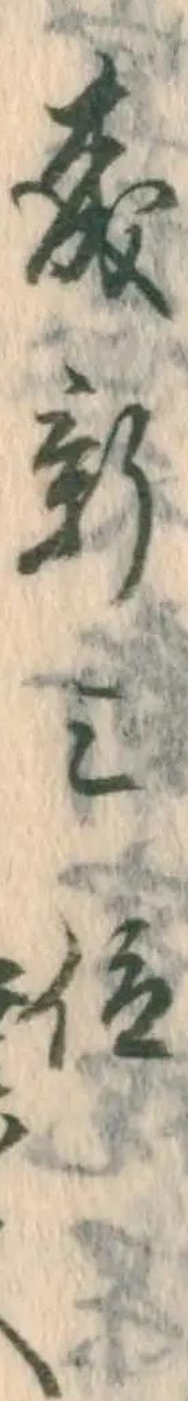森新三位
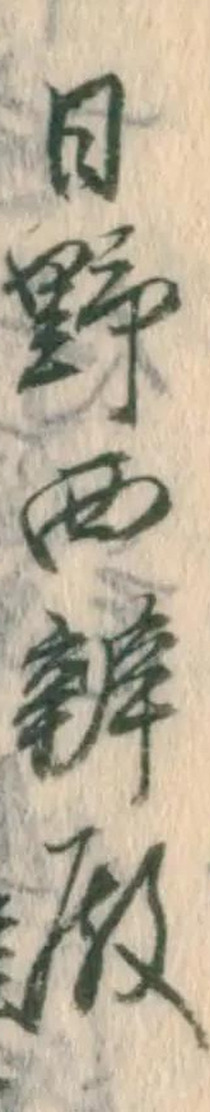日野西弁殿
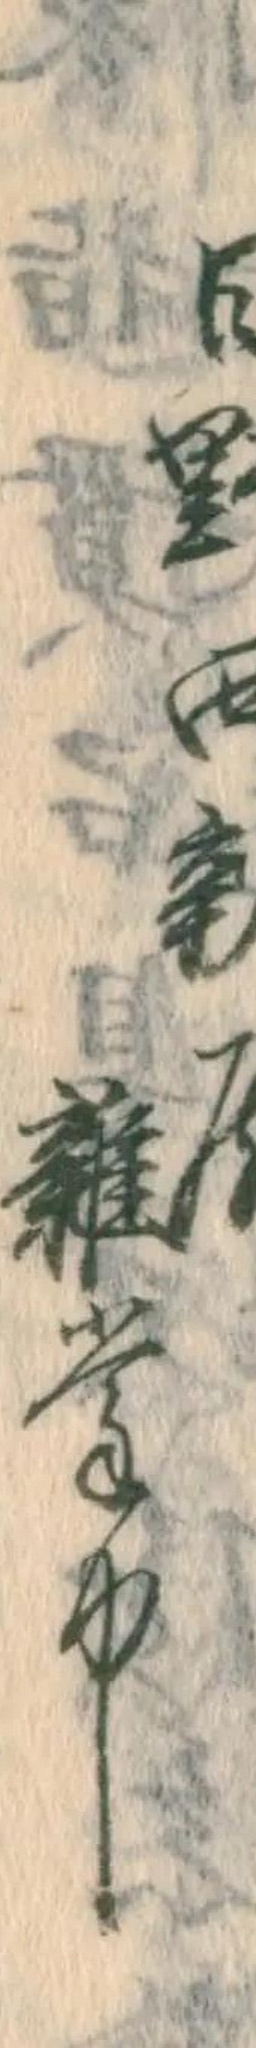雑掌中
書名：賀茂社記録. 第17冊
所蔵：国立国会図書館 National Diet Library, JAPAN
